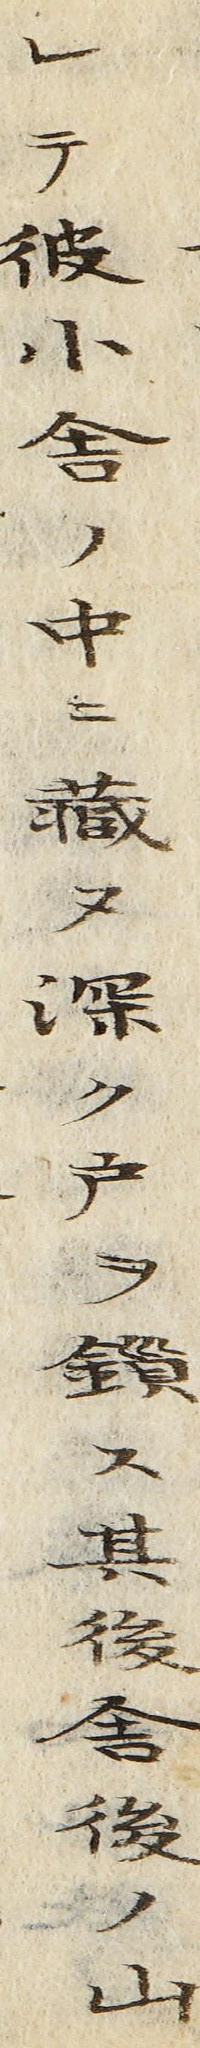レテ彼小舎ノ中ニ蔵ヌ深ク戸ヲ鎖ス其後舎後ノ山
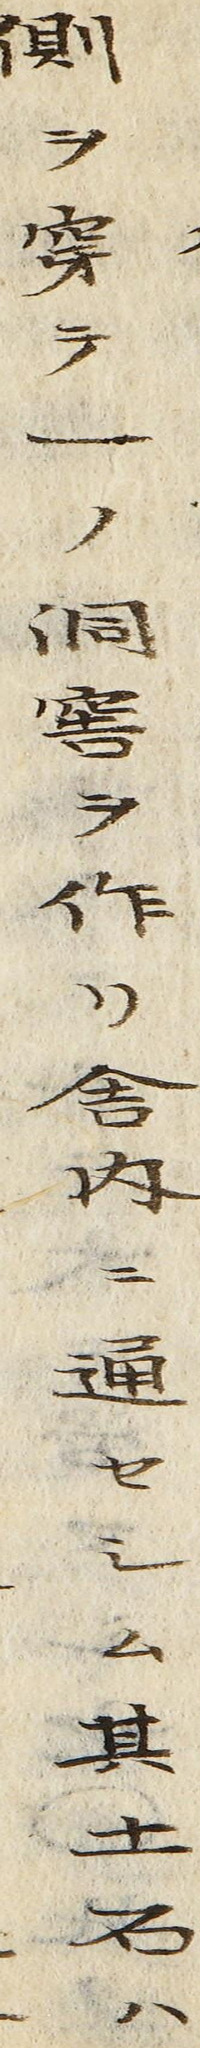側ヲ穿テ一ノ洞窖ヲ作リ舎内ニ通セシム其土石ハ
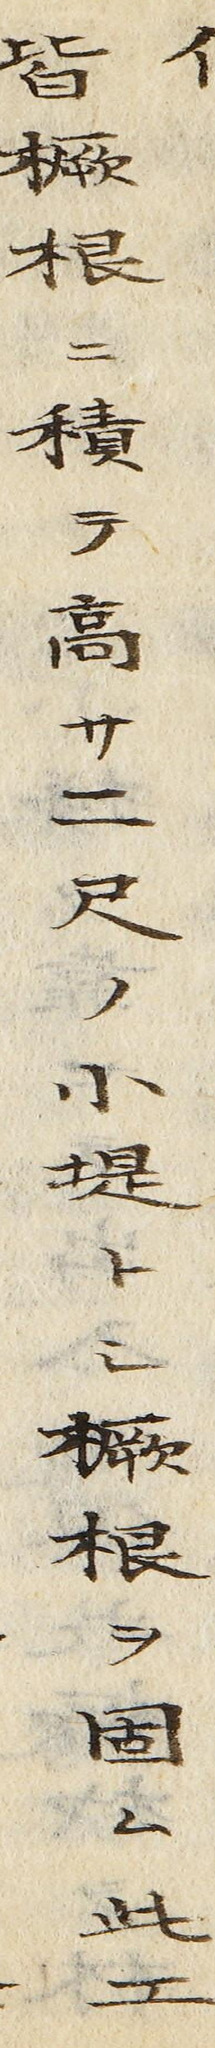皆橛根ニ積テ高サ二尺ノ小堤トシ橛根ヲ固ム此工
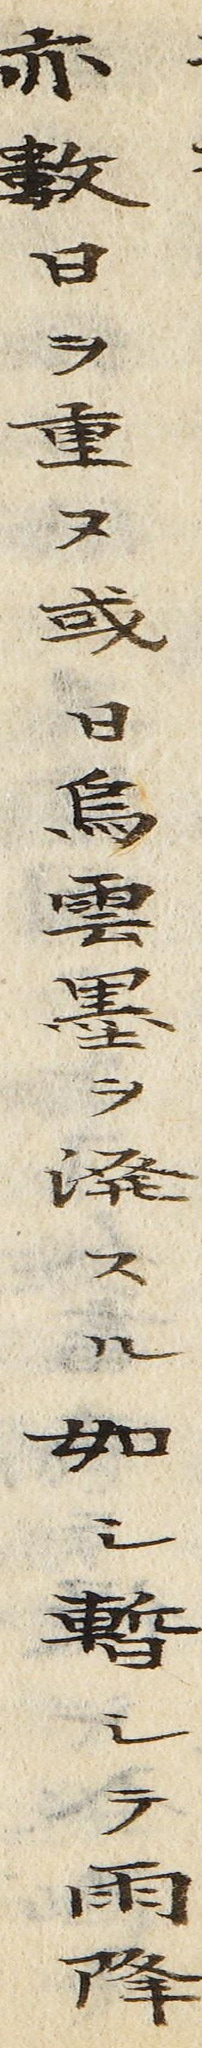亦数日ヲ重ヌ或日烏雲墨ヲ溌スル如シ暫シテ雨降
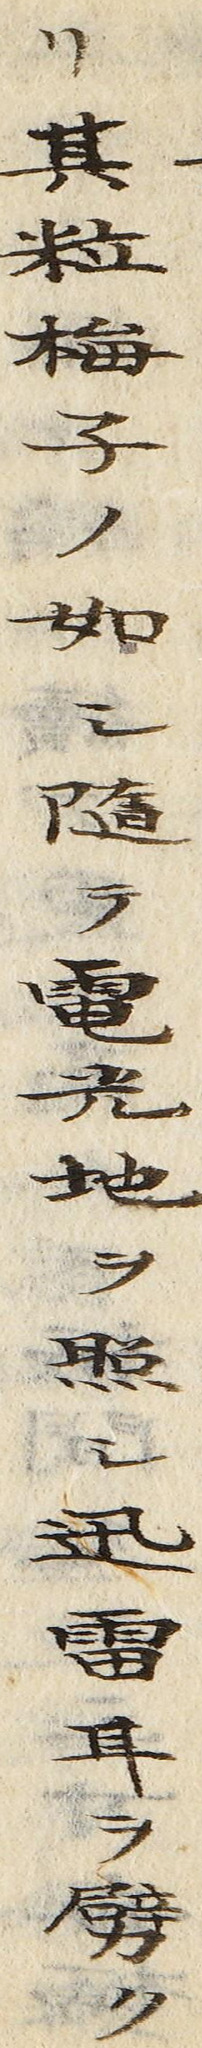リ其粒梅子ノ如シ随テ電光地ヲ照シ迅雷耳ヲ劈ク
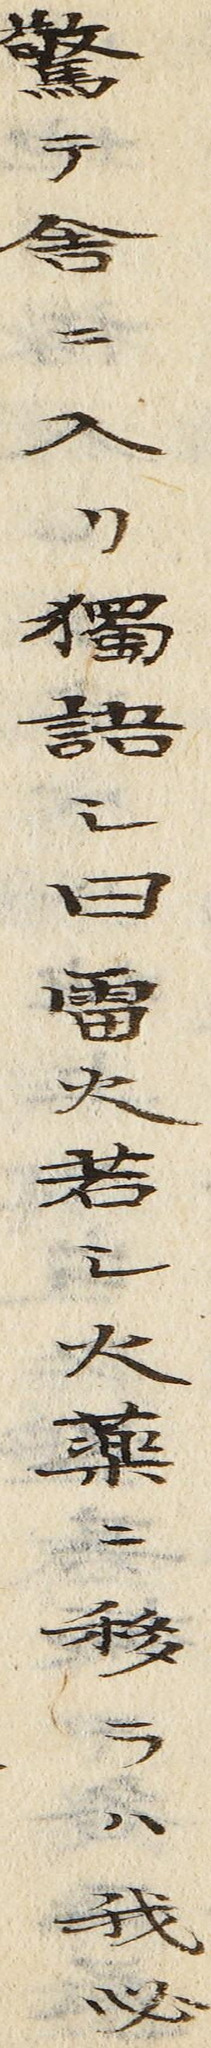驚テ舎ニ入リ独語シ曰雷火若シ火薬ニ移ラハ我必
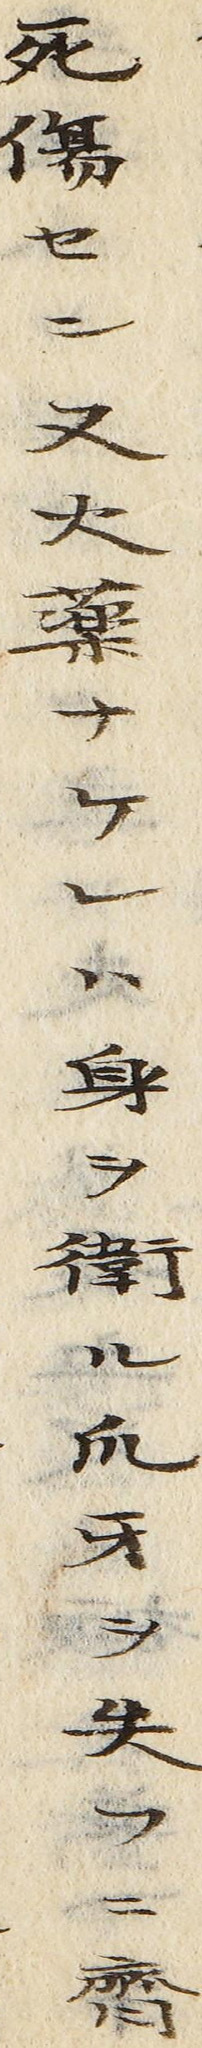死傷セン又火薬ナケレハ身ヲ衛る爪牙ヲ失フニ斉
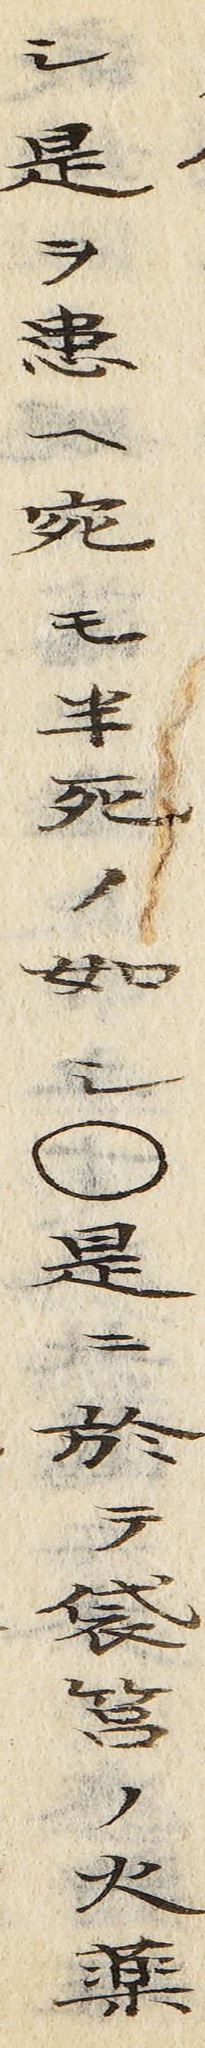シ是ヲ患ヘ宛モ半死ノ如シ◯是ニ於テ袋筥ノ火薬
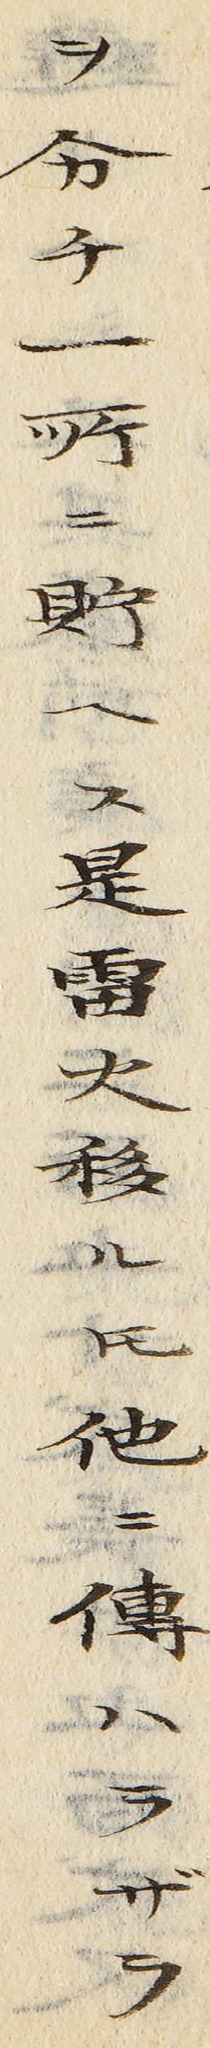ヲ分チ一所ニ貯ヘス是雷火移ルトモ他ニ伝ハラザラ
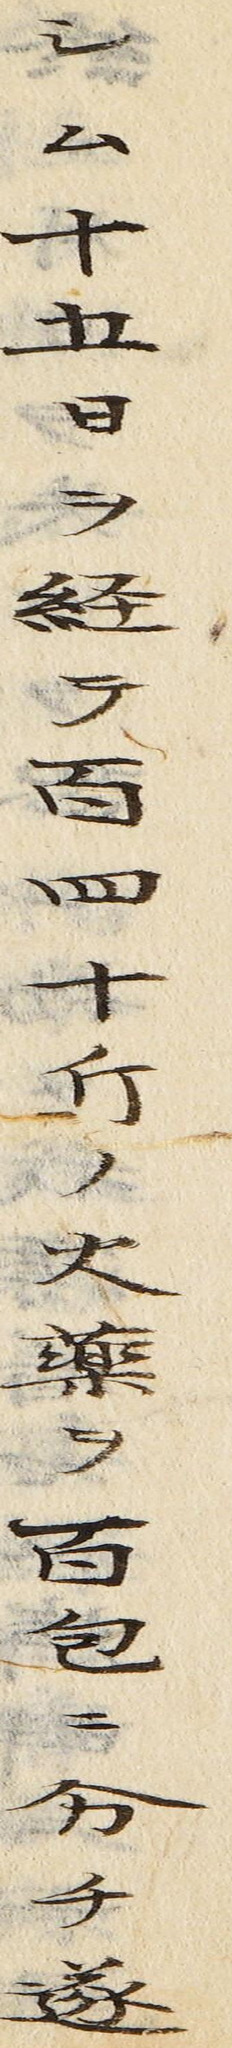シム十五日ヲ経テ百四十斤ノ火薬ヲ百包ニ分チ遂
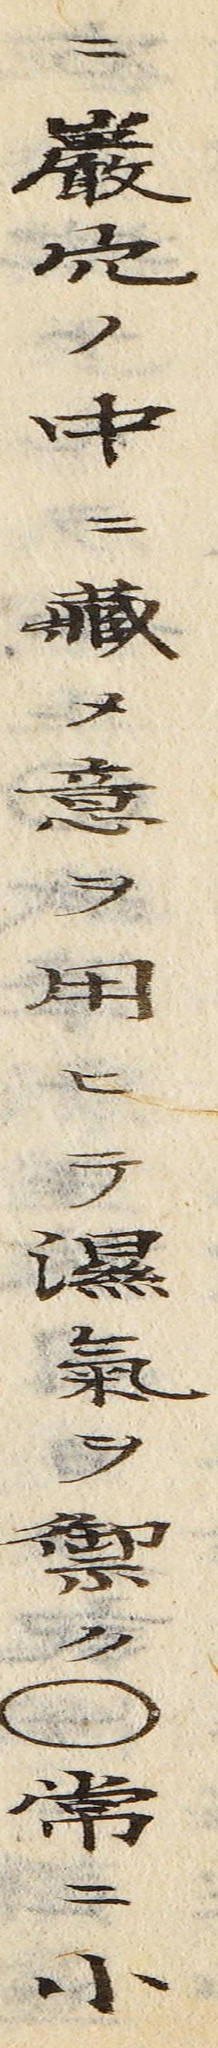ニ巌穴ノ中ニ蔵シテ意ヲ用ヒテ湿気ヲ禦ク◯常ニ小
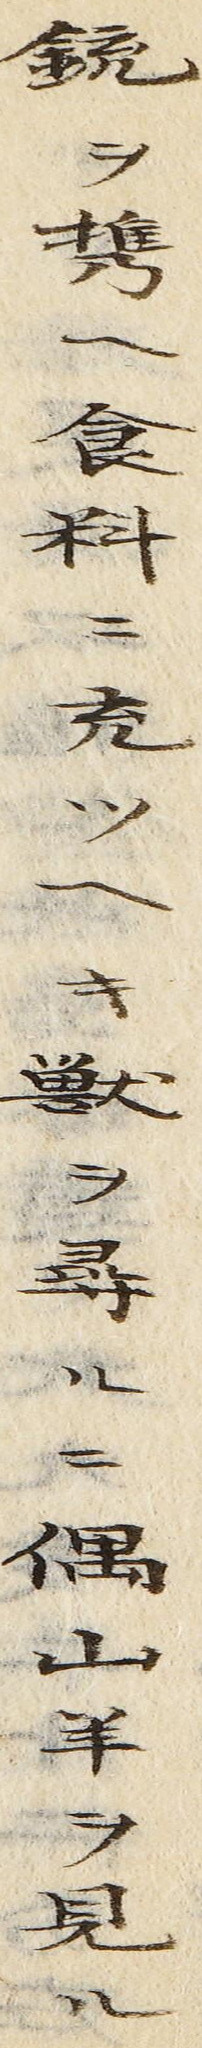銃ヲ携ヘ食料ニ充ツヘキ獣ヲ尋ルニ偶山羊ヲ見ル
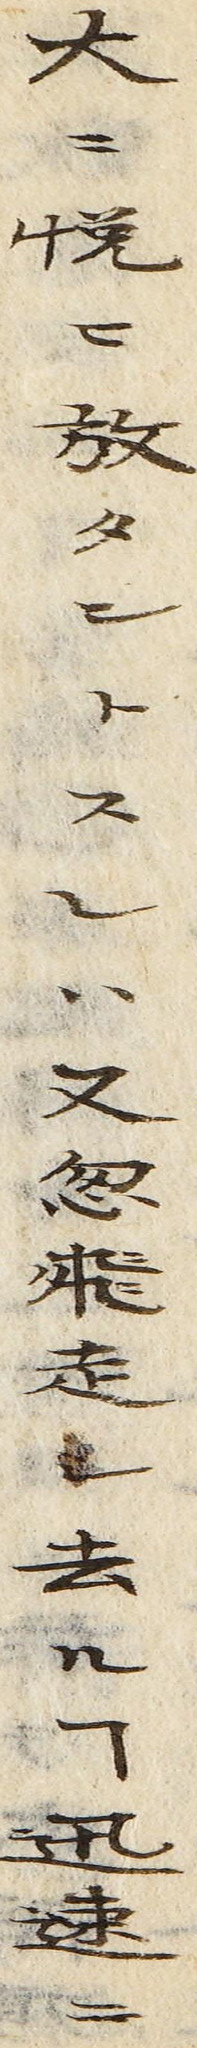大ニ悦ヒ放タントスレハ又忽飛走シ去ルコト迅速ニ
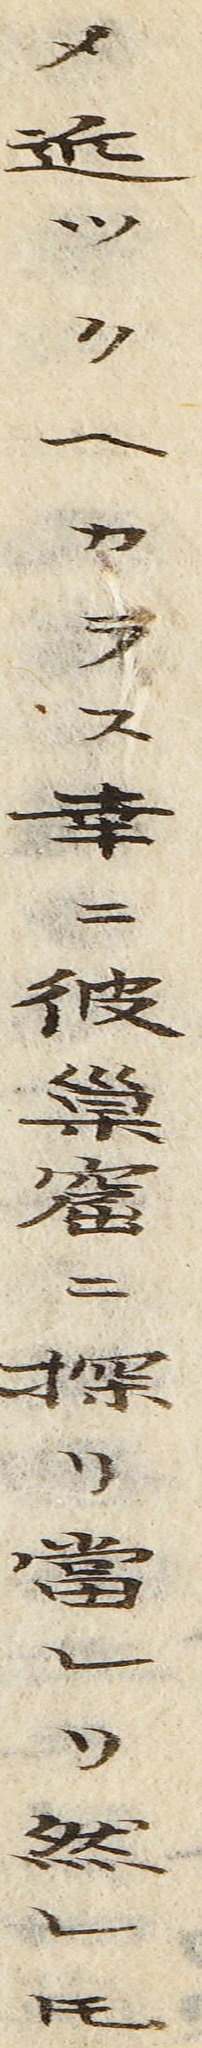シテ近ツクヘカラス幸ニ彼巣窟ニ探リ当レリ然レトモ
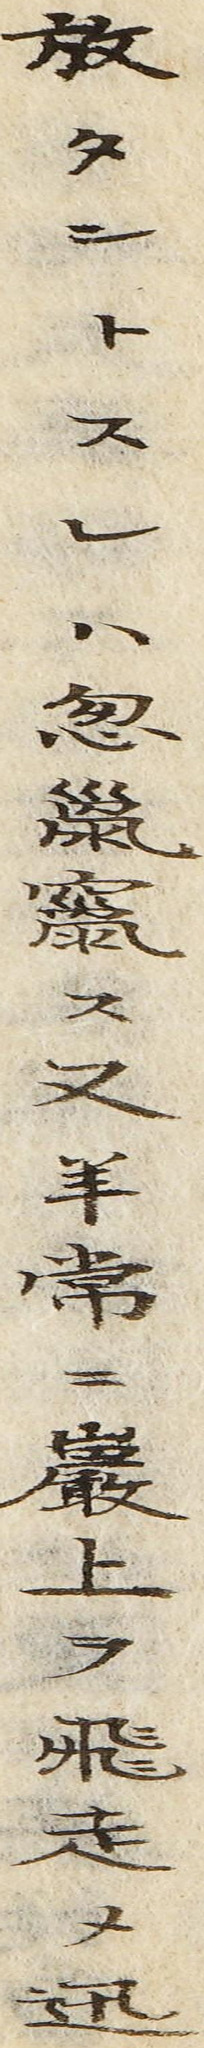放タントスレハ忽鼠竄ス又羊常ニ巌上ヲ飛走シテ迅
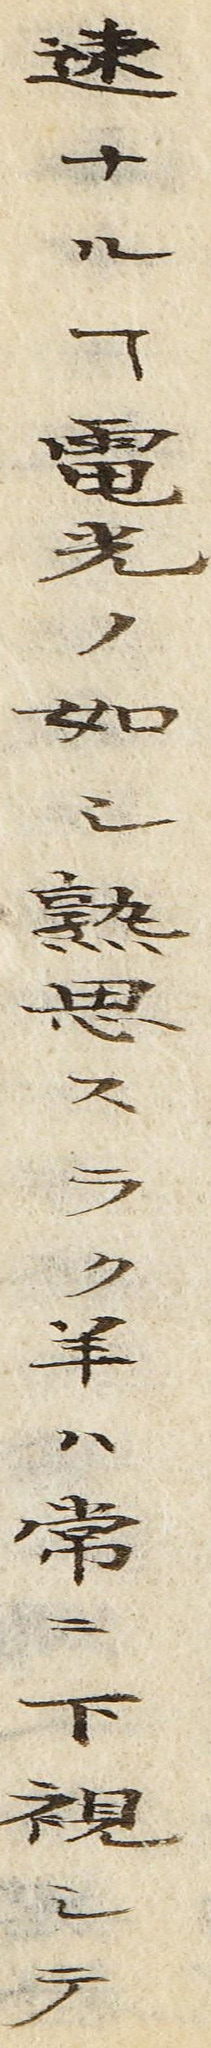速ナルコト電光ノ如シ熟思スラク羊ハ常ニ下視シテ
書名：漂流紀事
